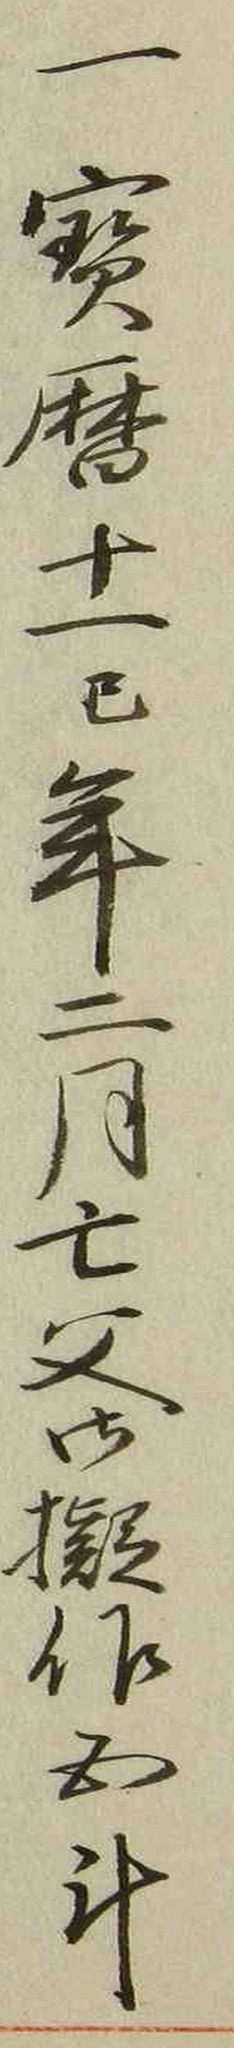一宝暦十一巳年二月亡父御擬作五斗
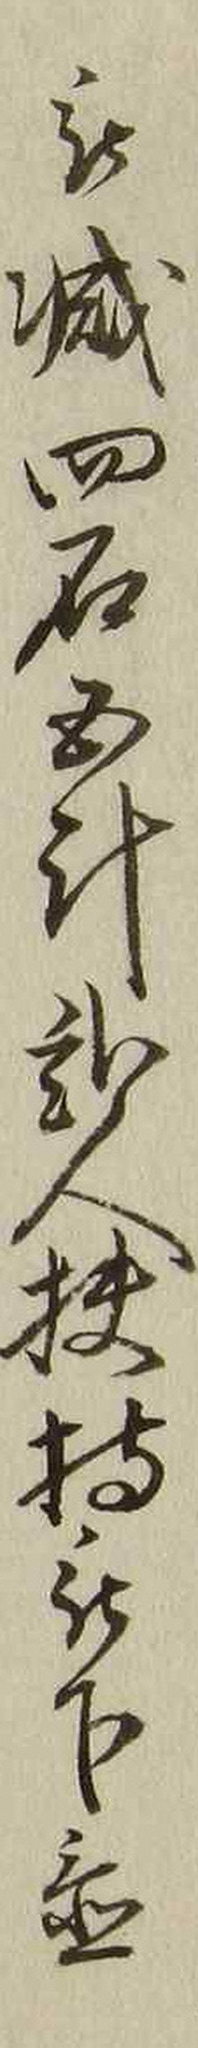被減四石五斗弐人扶持被下置
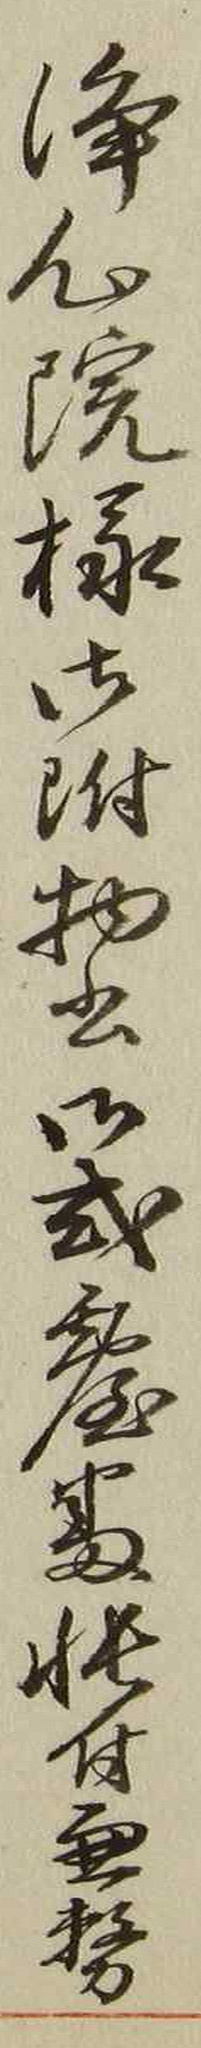浄心院様御附物書御式台番帳付兼務
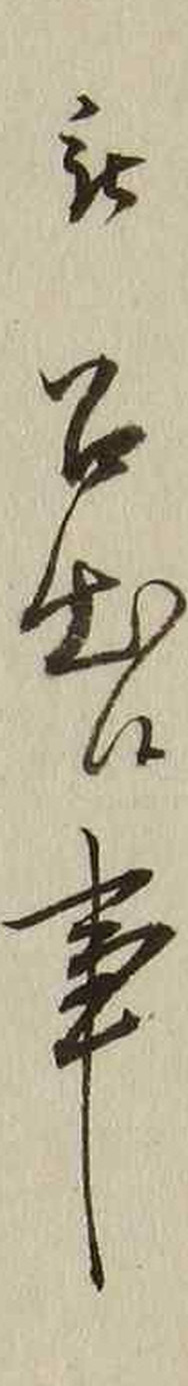被召出候事
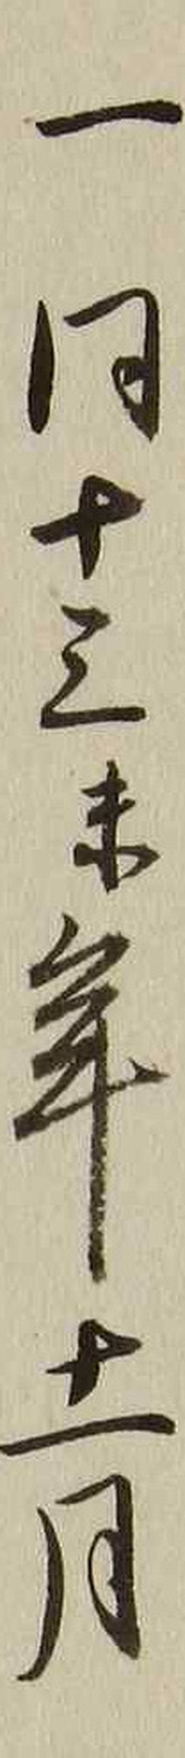一同十三未年十一月
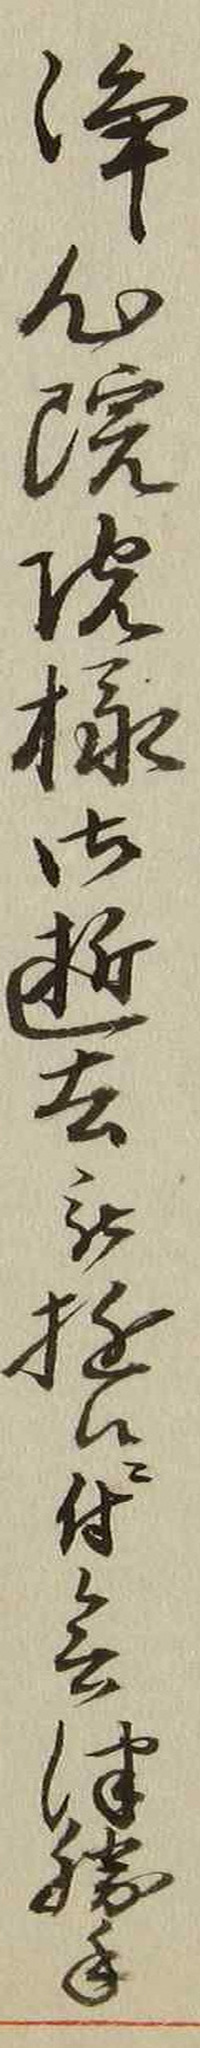浄心院院様御逝去被遊候ニ付会津勝手
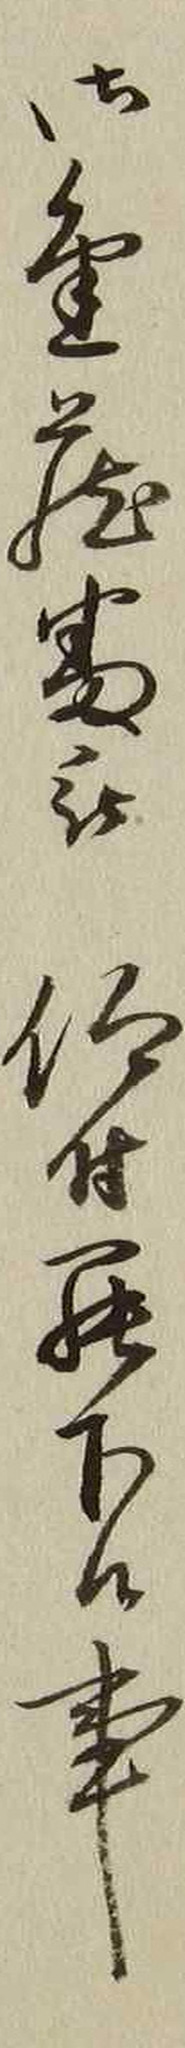御金蔵番被仰付罷下事候
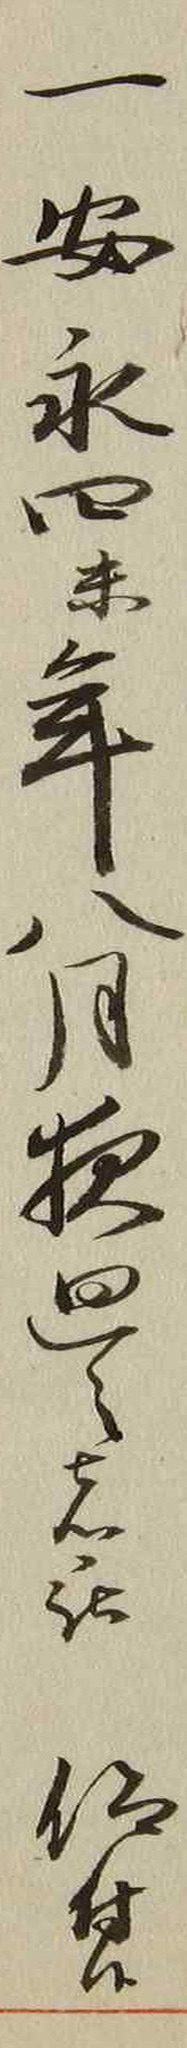一安永四未年八月夜廻之者被仰付候
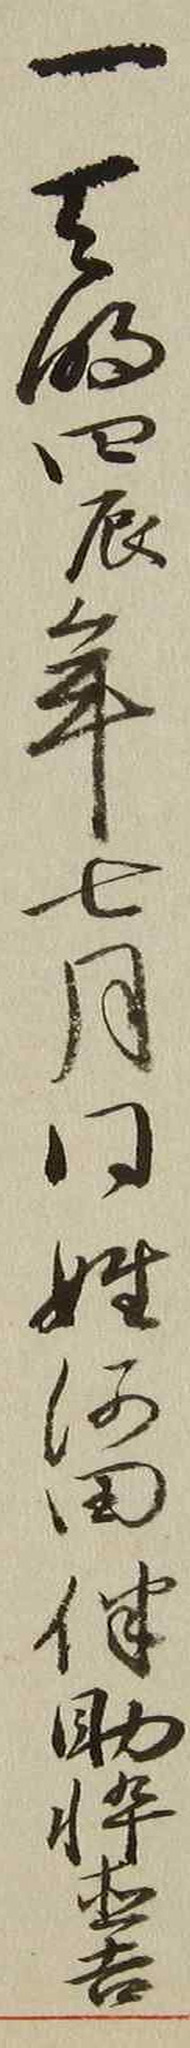一天明四辰年七月同姓河田伴助忰直吉
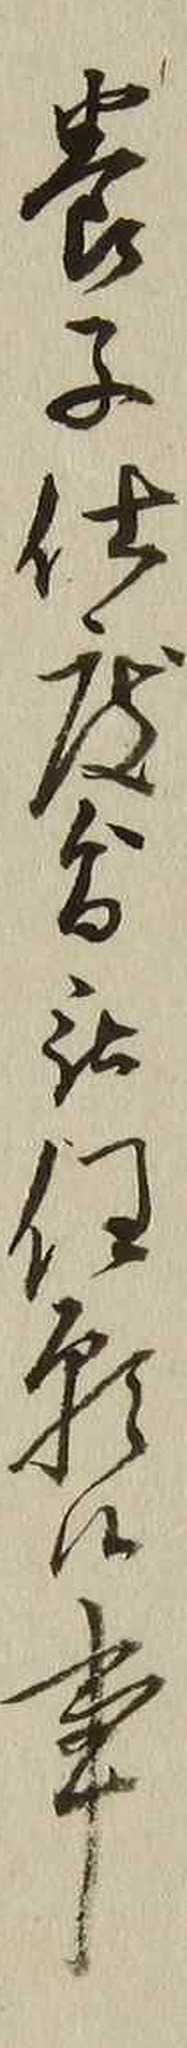養子仕度旨被任願候事
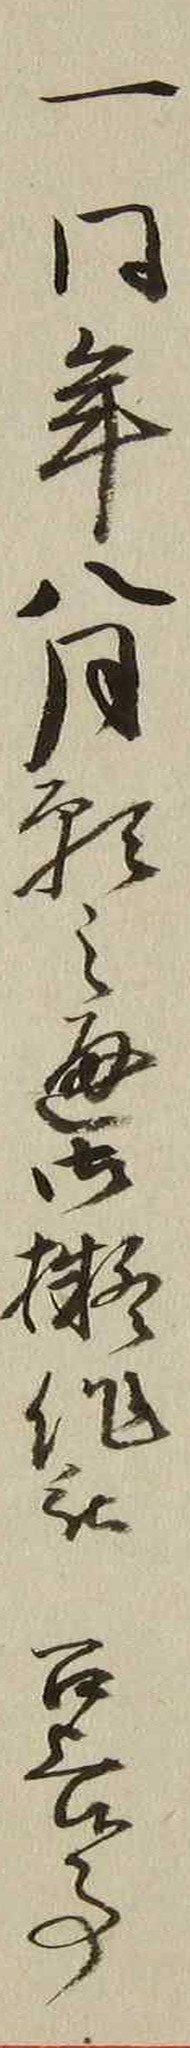一同年八月願之通御擬作被召上候事
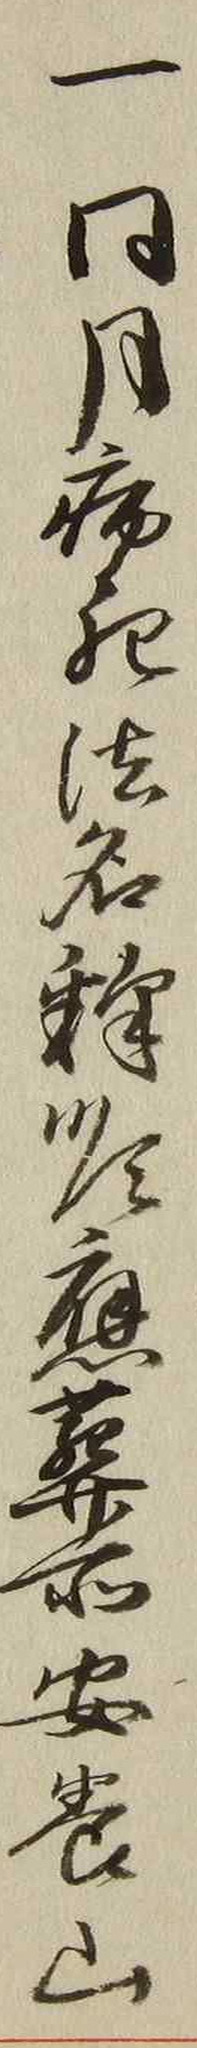一同月病死法名釈順応葬所安養山
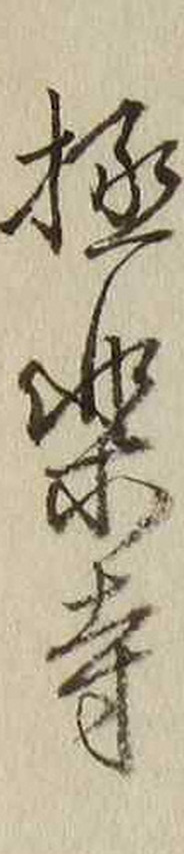極楽寺
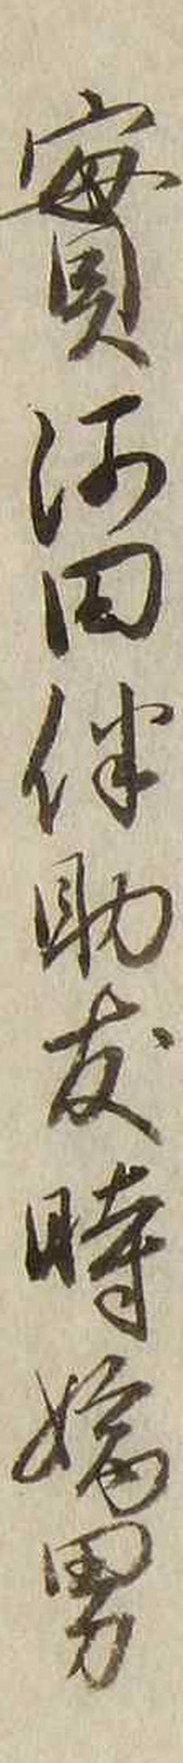実河田伴助友時嫡男

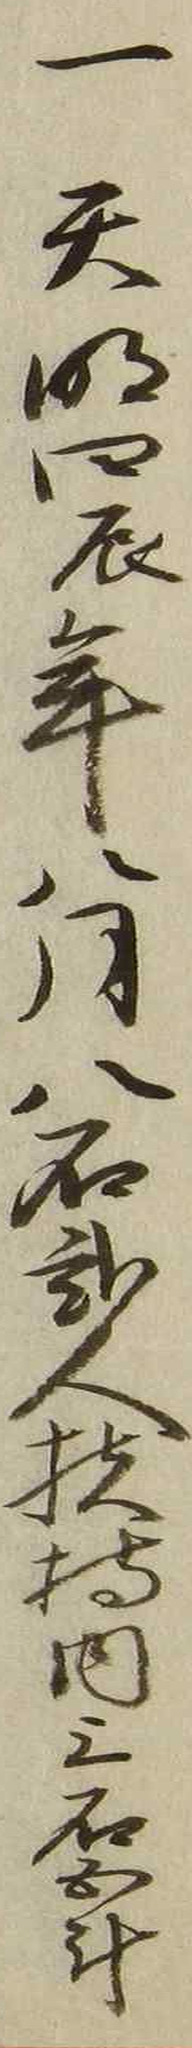一天明四辰年八月八石弐人扶持内三石五斗
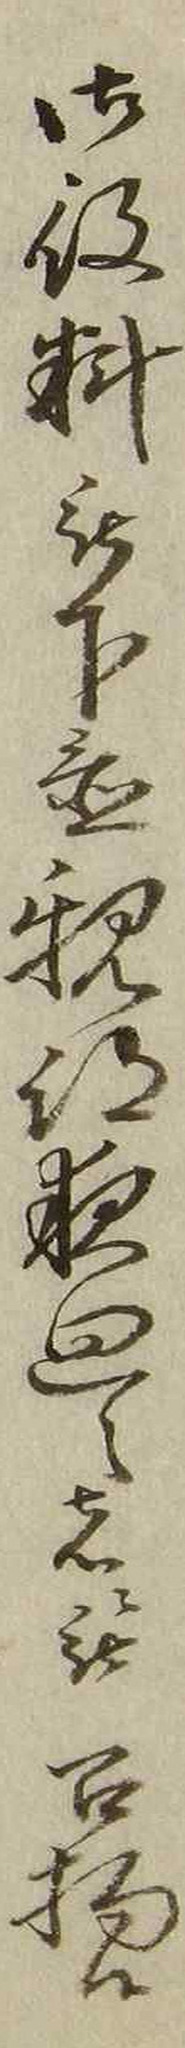御役料被下置親跡夜廻之者ニ被召抱候
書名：諸士系譜　巻之102　か之部10
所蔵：会津若松市立会津図書館
